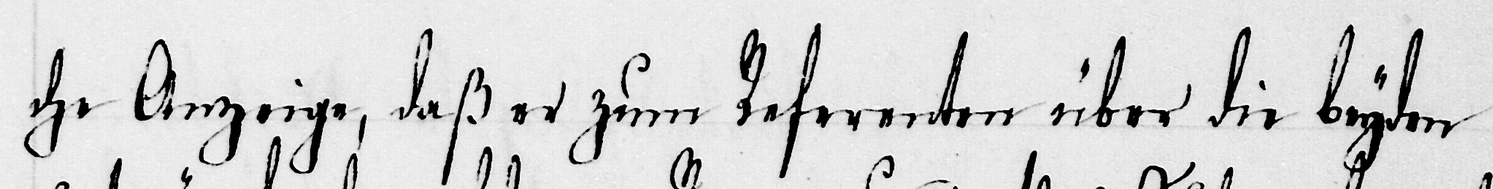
che Anzeige, daß er zum Referenten über die beyden
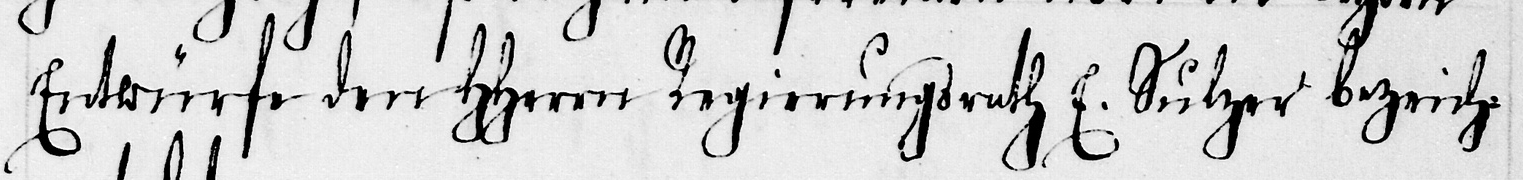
Entwürfe den HHerrn Regierungsrath E. Sulzer bezeich¬
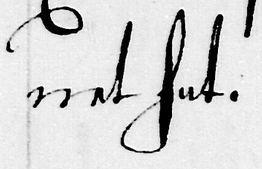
net hat.
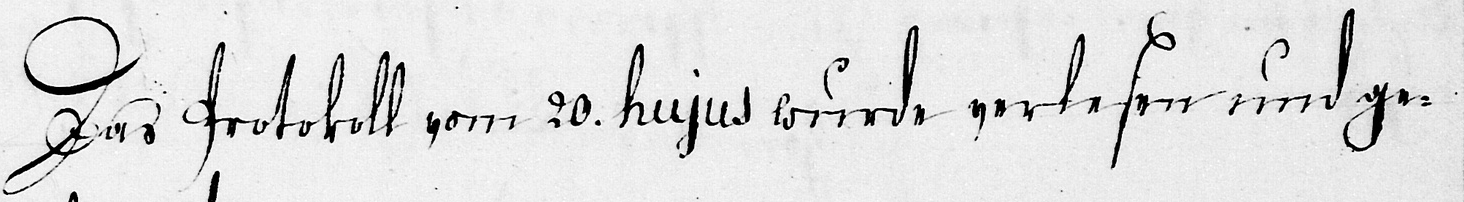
Das Protokoll vom 20. hujus wurde verlesen und ge¬
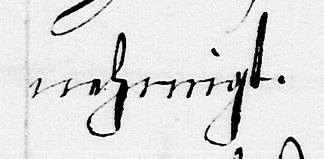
nehmigt.
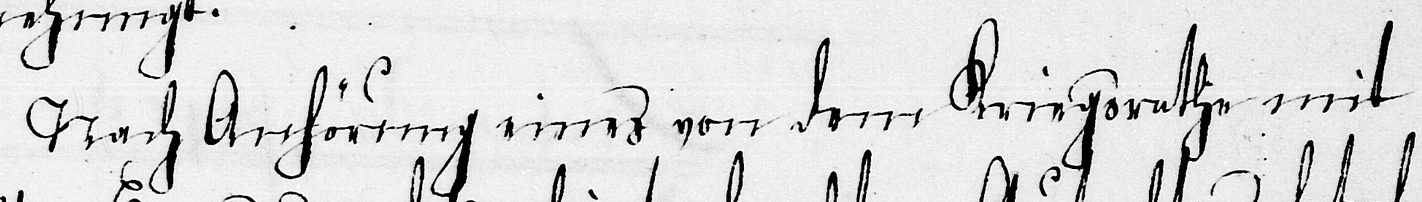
Nach Anhörung eines von dem Kriegsrathe mit
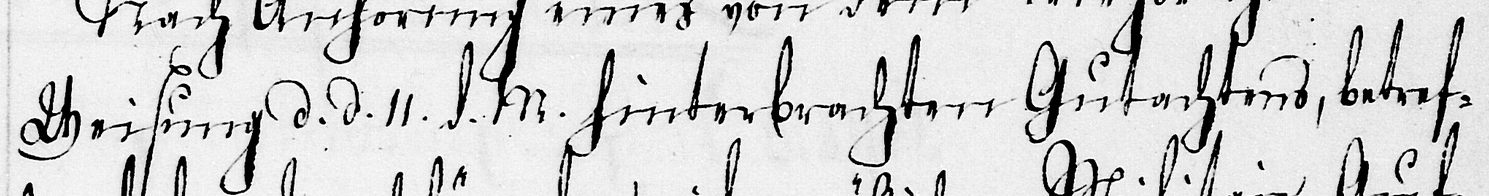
Weisung d. d. 11. d. M. hinterbrachten Gutachtens, betref¬
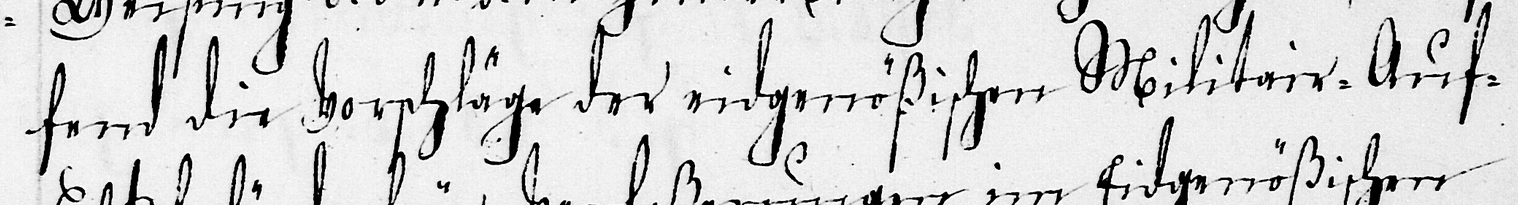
fend die Vorschläge der eidgenößischen Militair-Auf¬
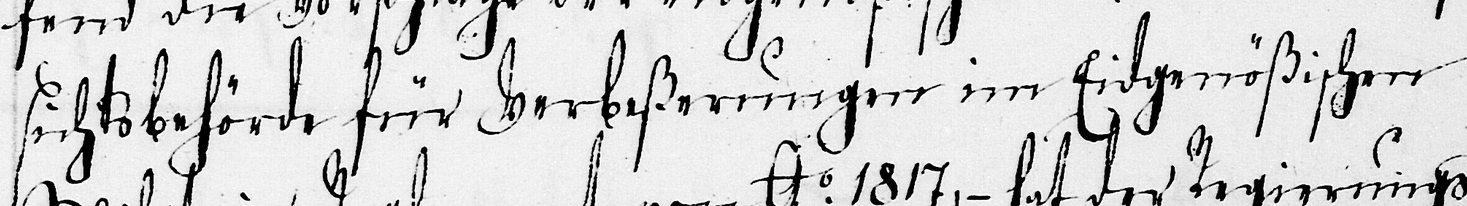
sichtsbehörde für Verbeßerungen im Eidgenößischen
